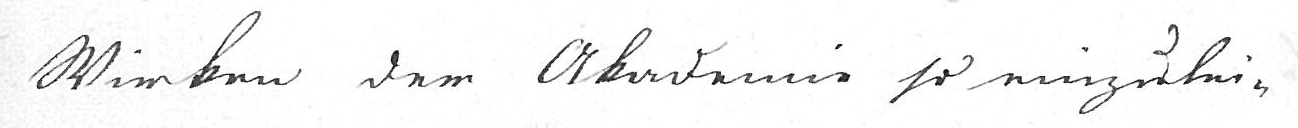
Wirken der Akademie so einzulei-
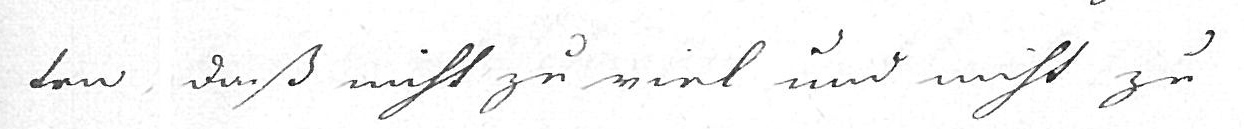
ten, daß nicht zu viel und nicht zu
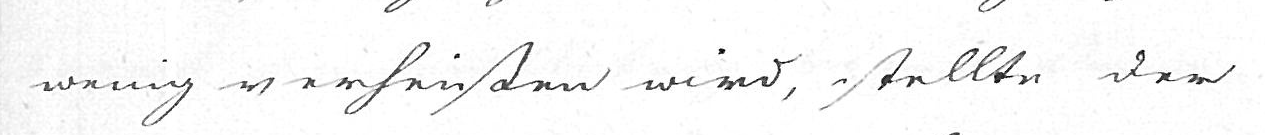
wenig verheißen wird, stellte der
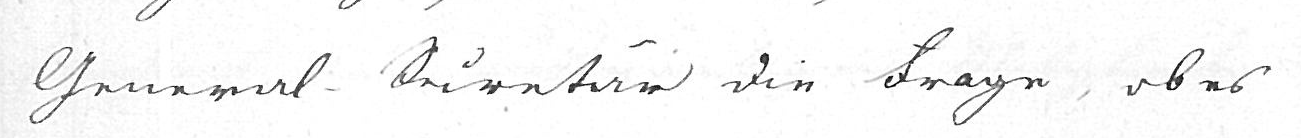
General-Secretär dir Frage, ob es
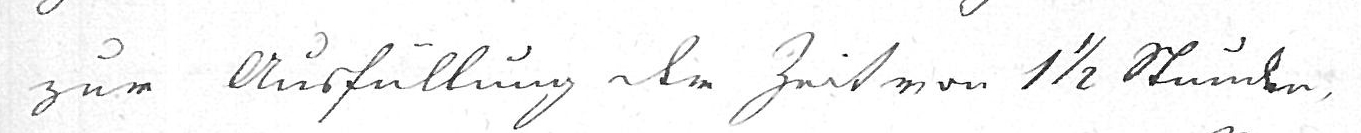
zur Ausfüllung der Zeit von 1 1/2 Stunden,
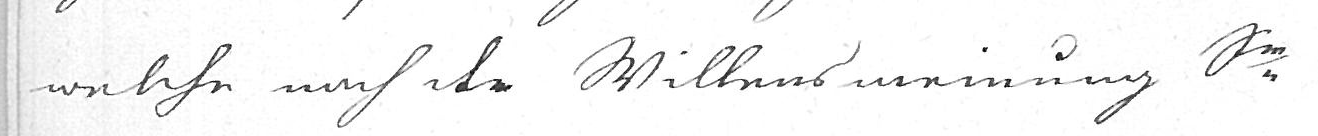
welche nach der Willensmeinung Sr.
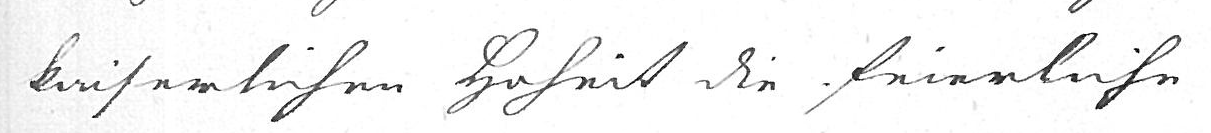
kaiserlichen Hoheit die feierliche
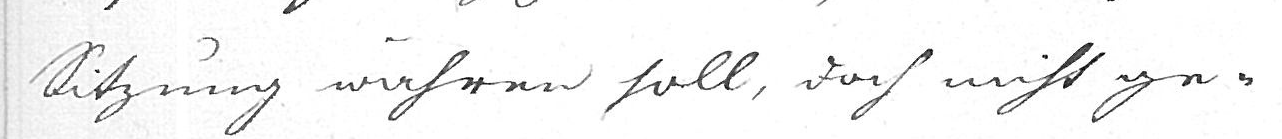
Sitzung währen solle, doch nicht ge-
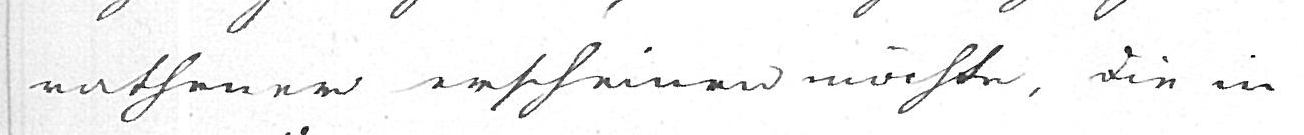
rathener erscheinen möchte, die in
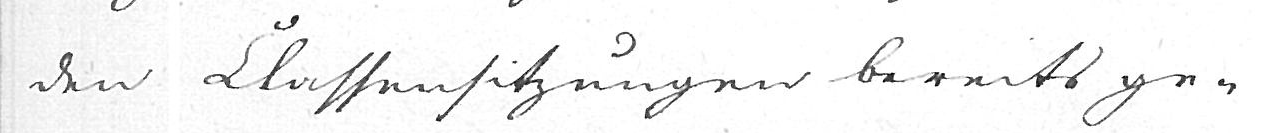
den Classensitzungen bereits ge-
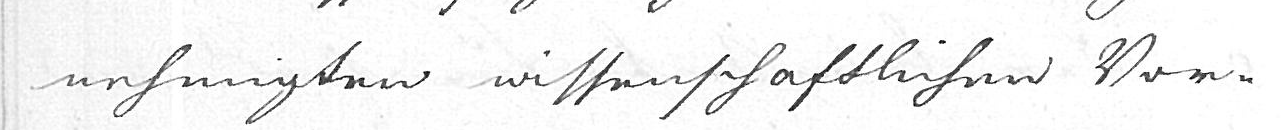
nehmigten wissenschaftlichen Vor-
